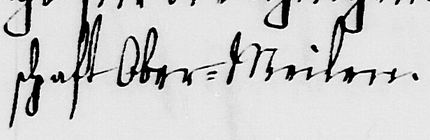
schaft Ober-Meilen
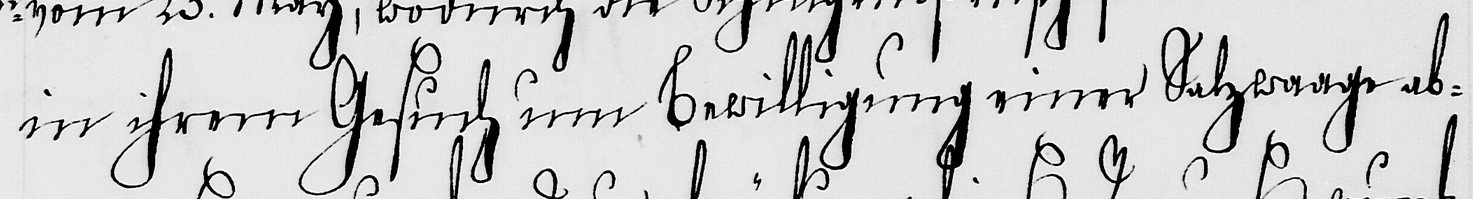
in ihrem Gesuch um Bewilligung einer Salzwaage ab¬
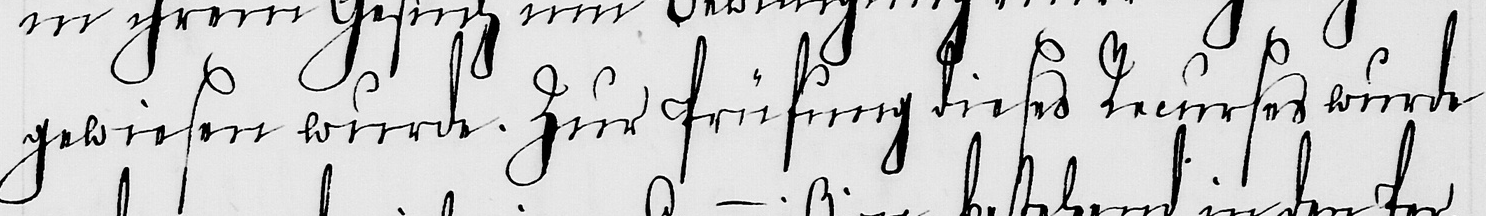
gewiesen wurde. Zur Prüfung dieses Recurses wurde
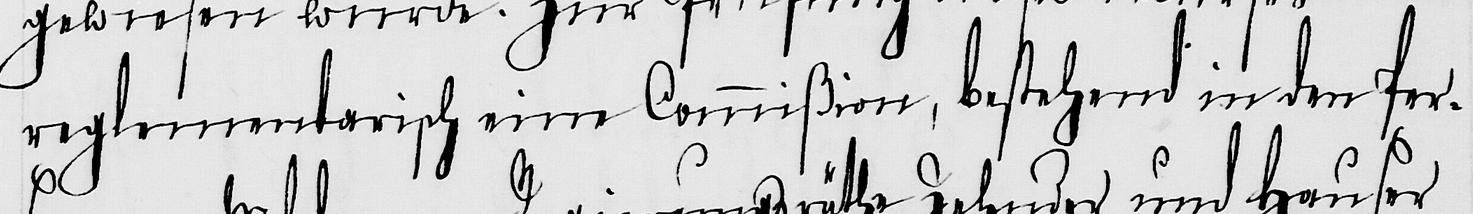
reglementarisch eine Commißion, bestehend in den Per¬
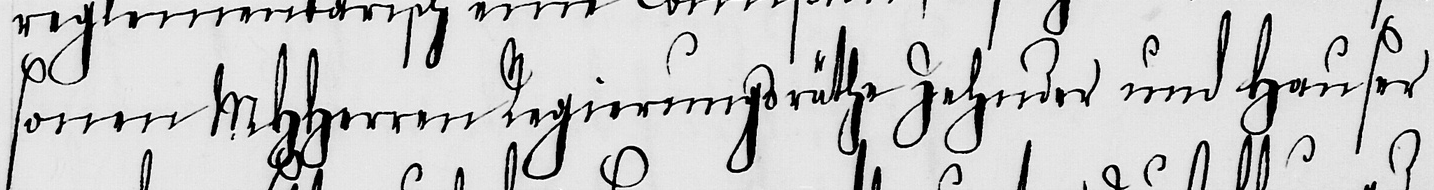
sonen MHHerren Regierungsräthe Zehnder und Hauser
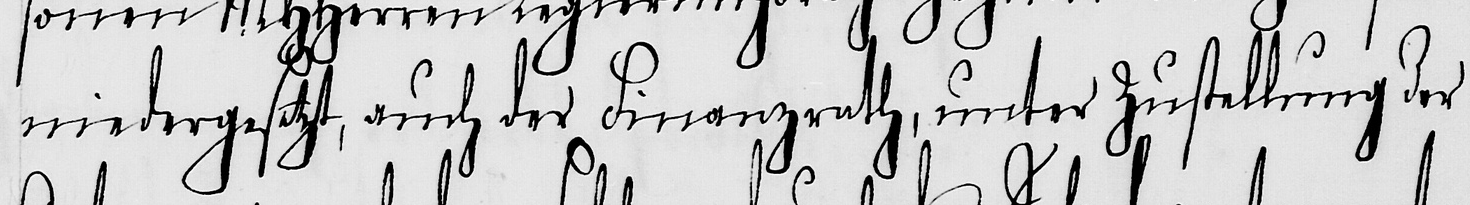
niedergesetzt, auch der Finanzrath unter Zustellung der
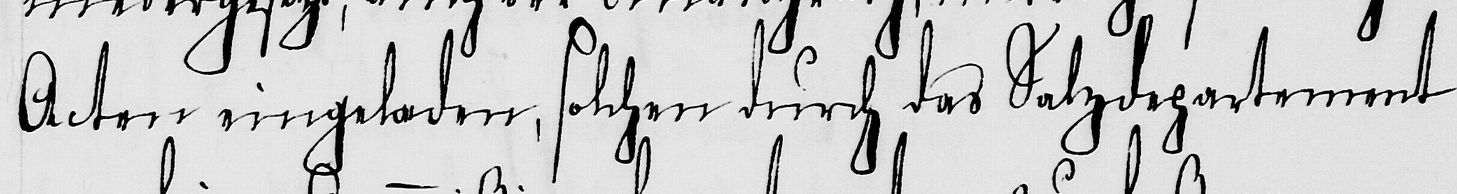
Acten eingeladen, solchen durch das Salzdepartement
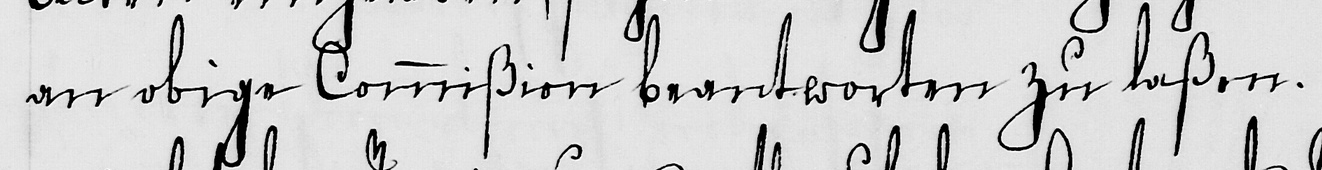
an obige Commißion beantworten zu laßen.
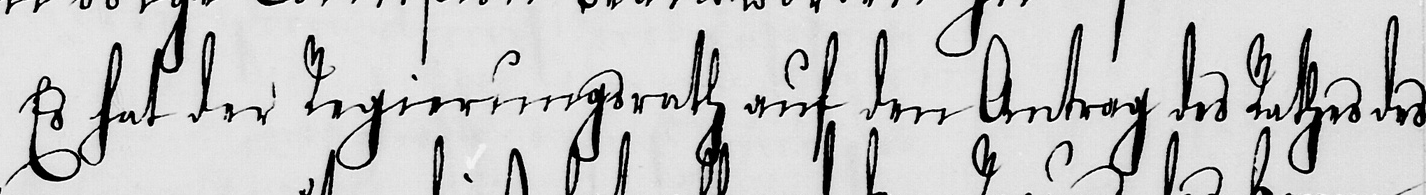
Es hat der Regierungsrath auf den Antrag des Rathes
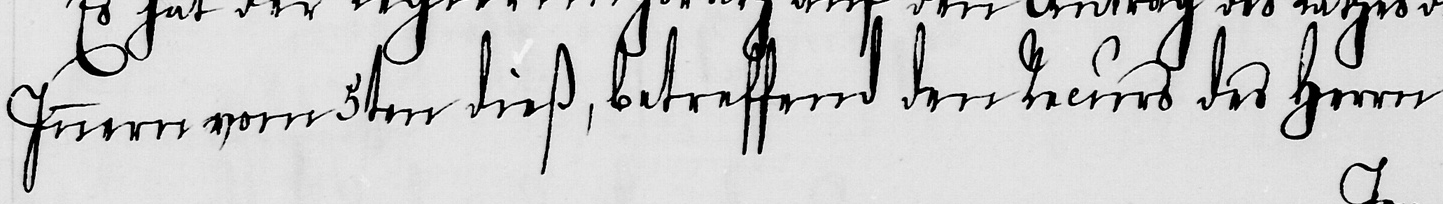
Innern vom 5ten dieß, betreffend den Recurs des Herrn
